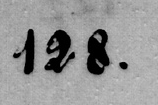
435.
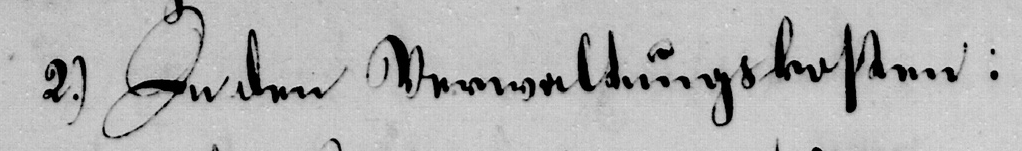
2.) In den Verwaltungskosten:
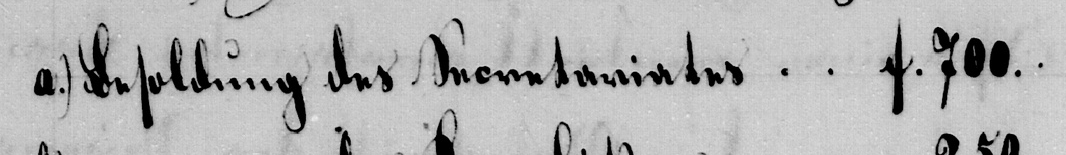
a.) Besoldung des Secretariates f. 700.
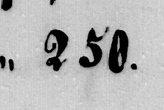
2038.
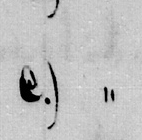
c.)
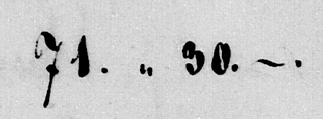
71. “. 30. “
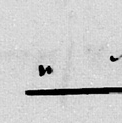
3.
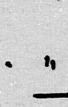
212.
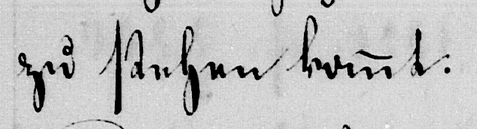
zu stehen kommt.
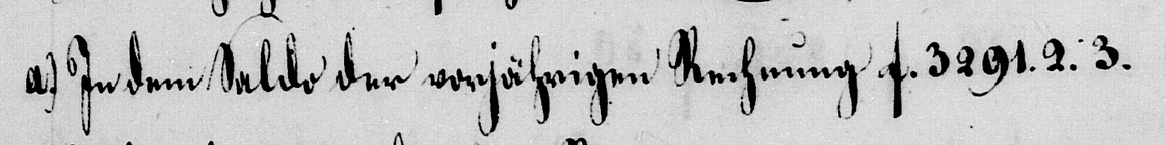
a.) In dem Saldo der vorjährigen Rechnung f. 3291. ß. 2.
